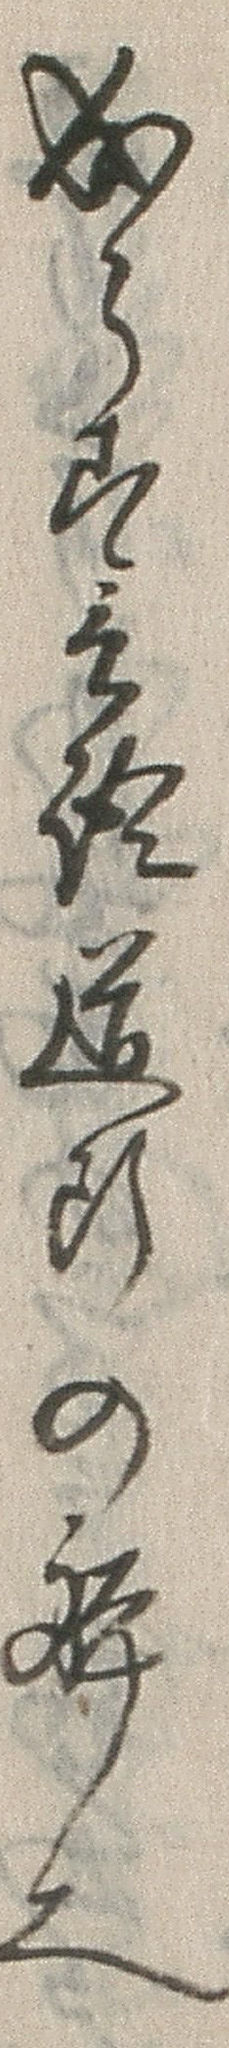成らす言語道断の体也
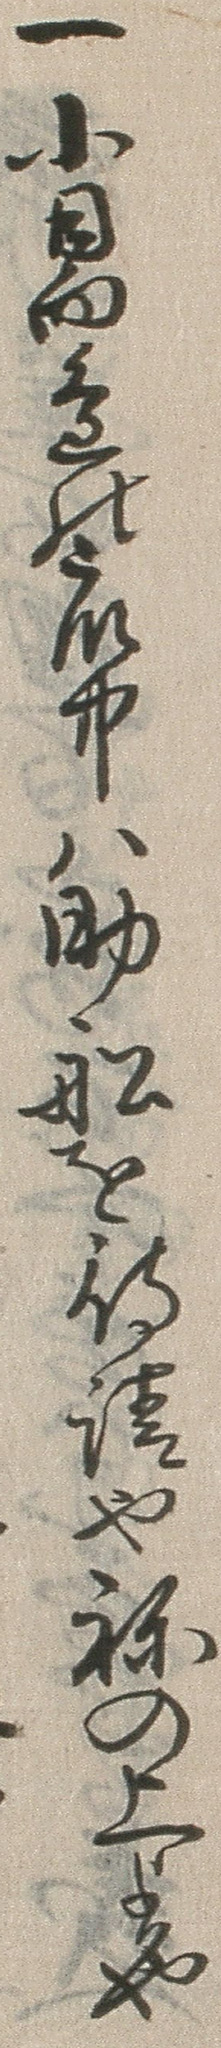一小日向辺の衆中は助船を待請やねの上よりや
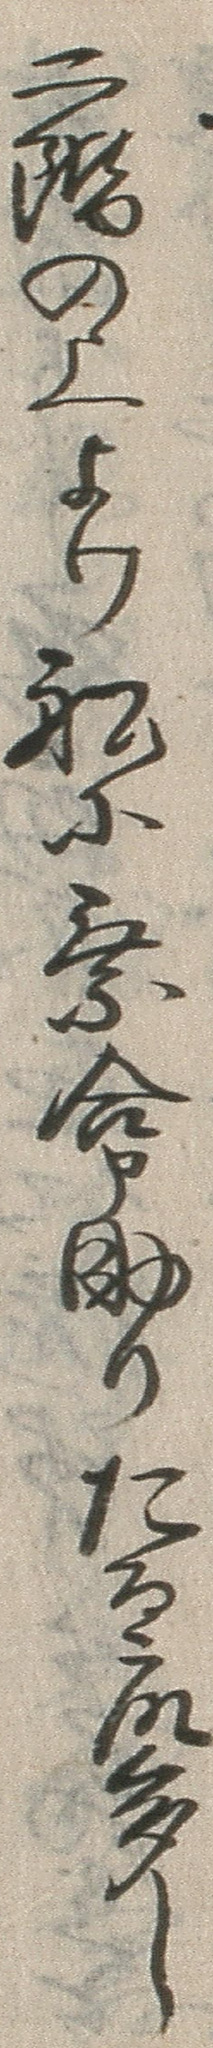二階の上より船に乗合申助りたる衆多し
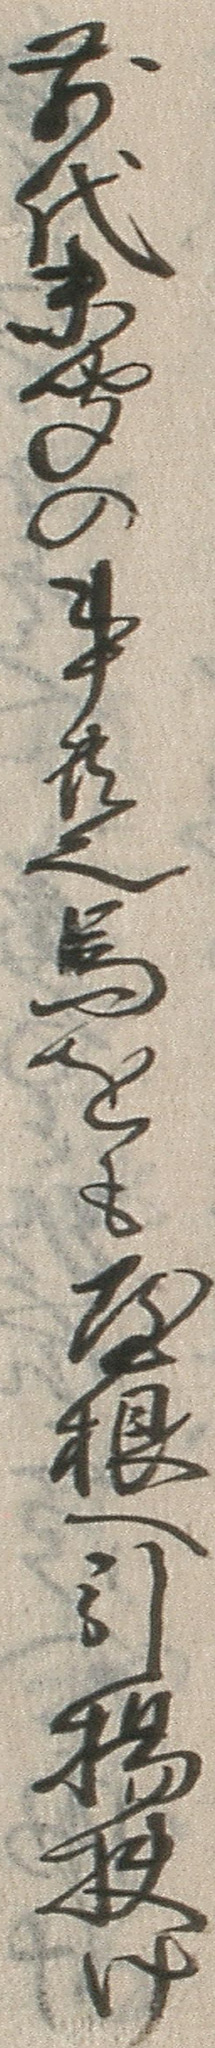前代未聞の事共也馬をも屋根へ引揚扶け
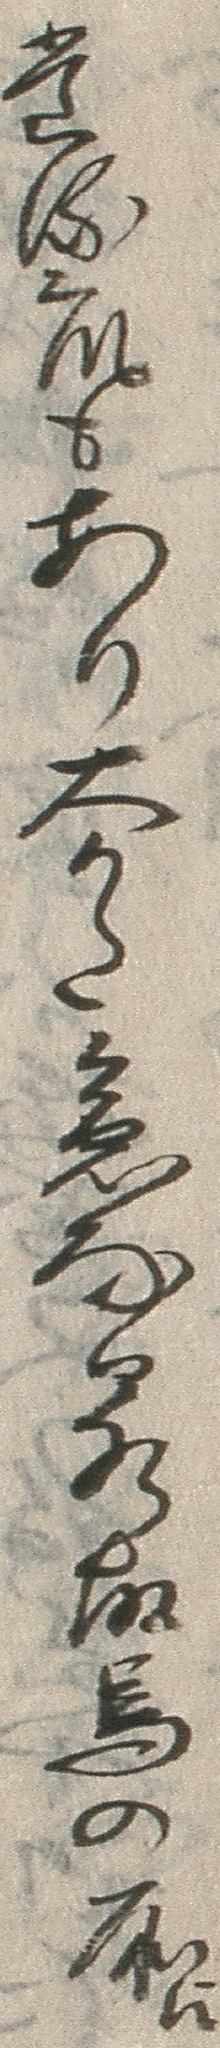たる衆もあり大かた急なる水故馬の所江
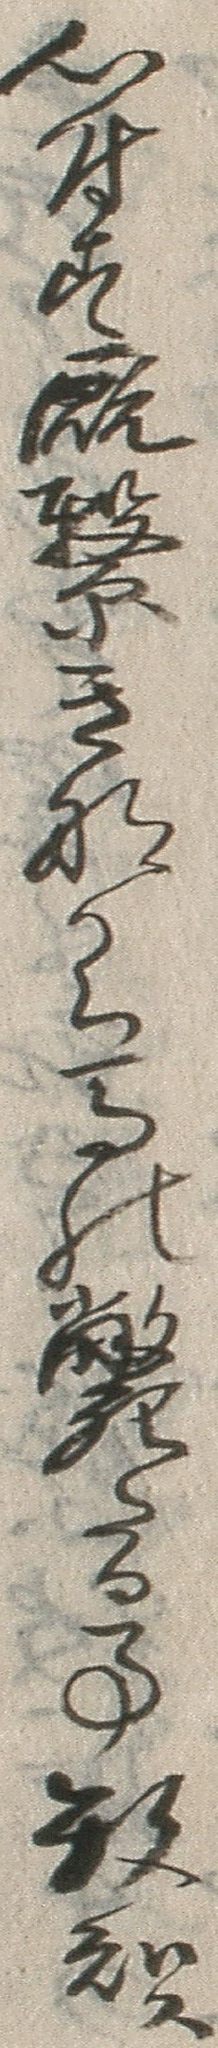心付す厩繫きなから馬の斃たる事数知ス
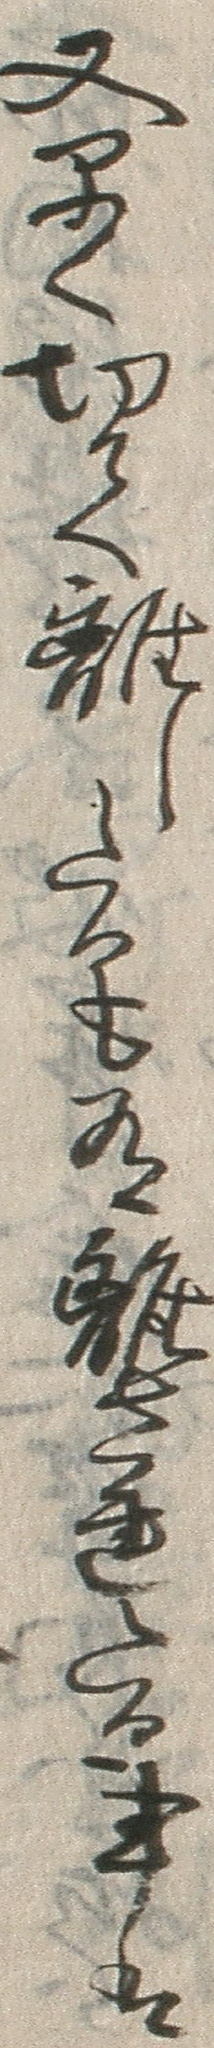又早く切て離したるも有離されたる事は
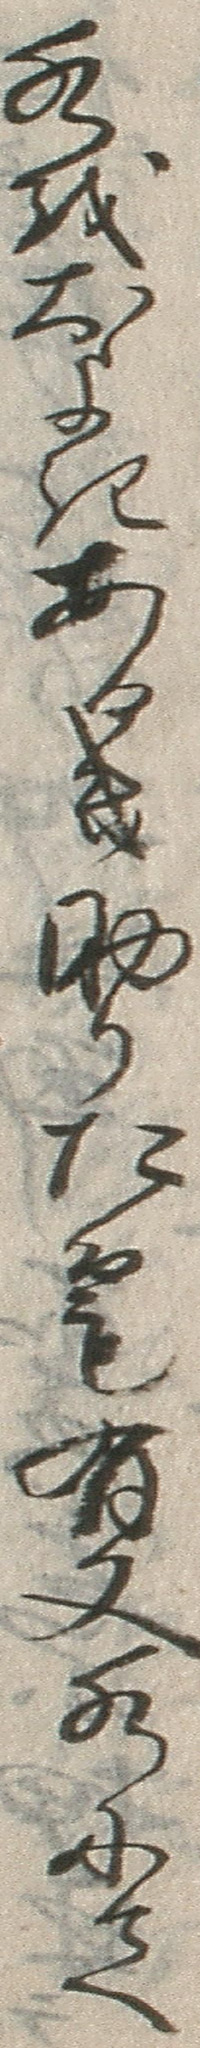水をおよきあるき助りたるも有又水にて
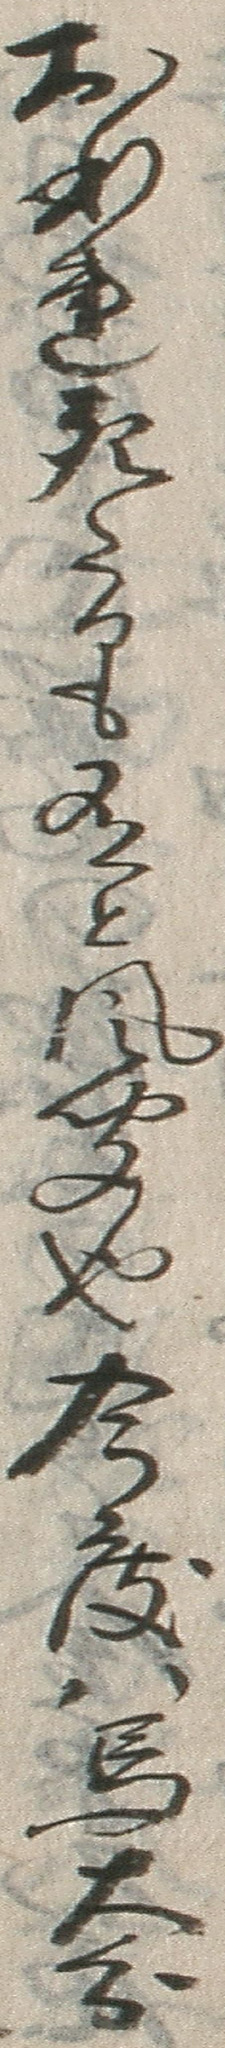おほれ死たるも有と風聞や今度は馬大分
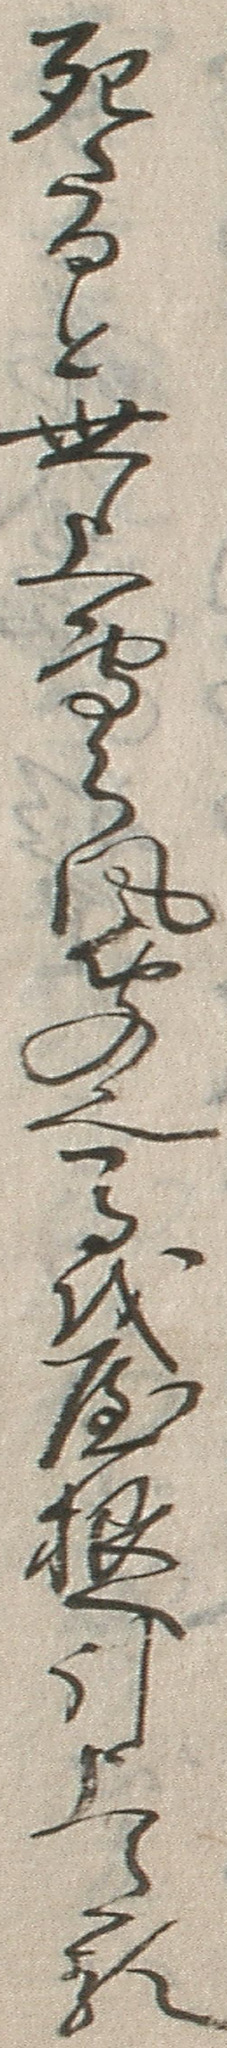死たると世上専ら風聞也馬を屋根へ引上たる

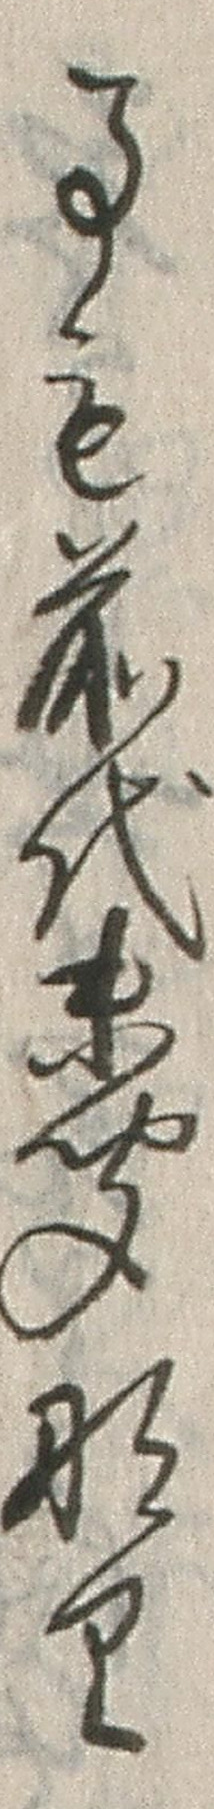事も前代未聞なり
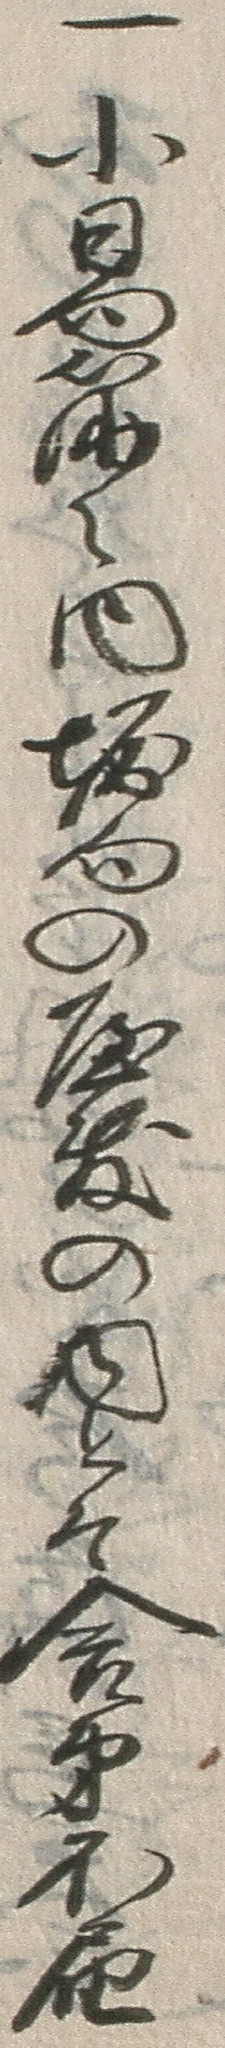一小日向筋之内堀向の屋敷の内とは舎弟不届
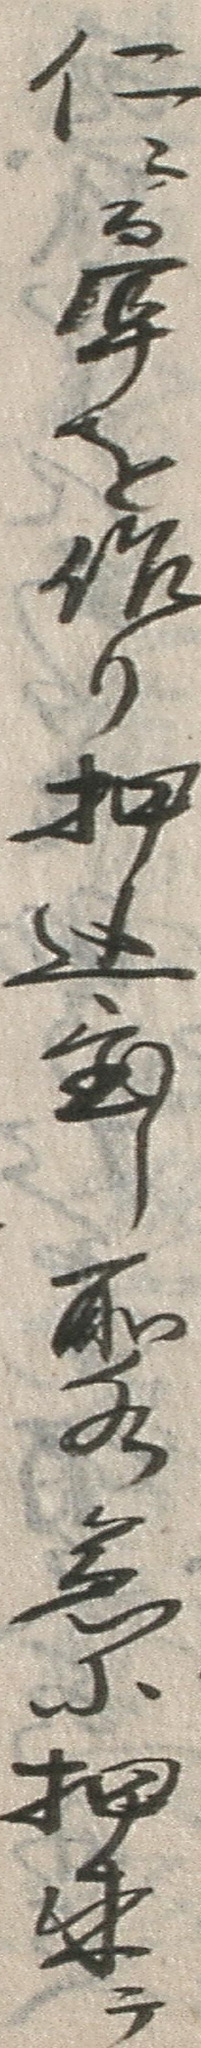仁に而牢を作り押込置候所水急に押来テ
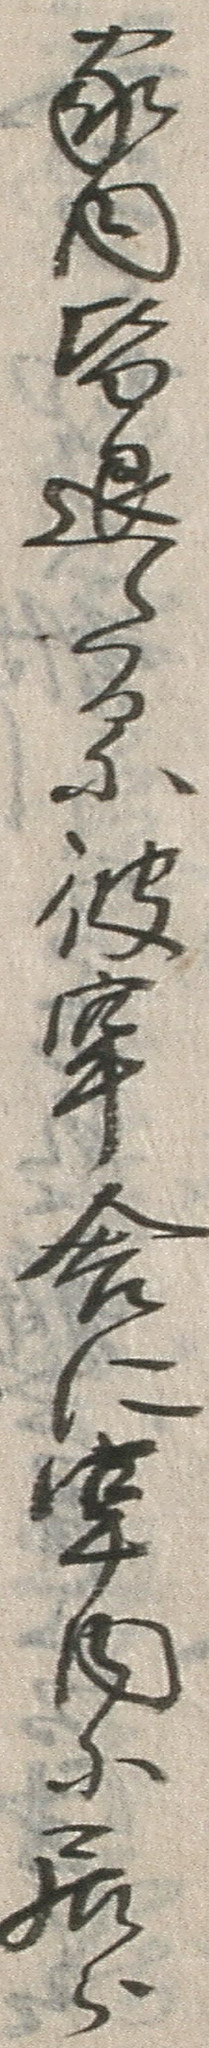家内皆退たるに彼牢舎に牢内に居ら
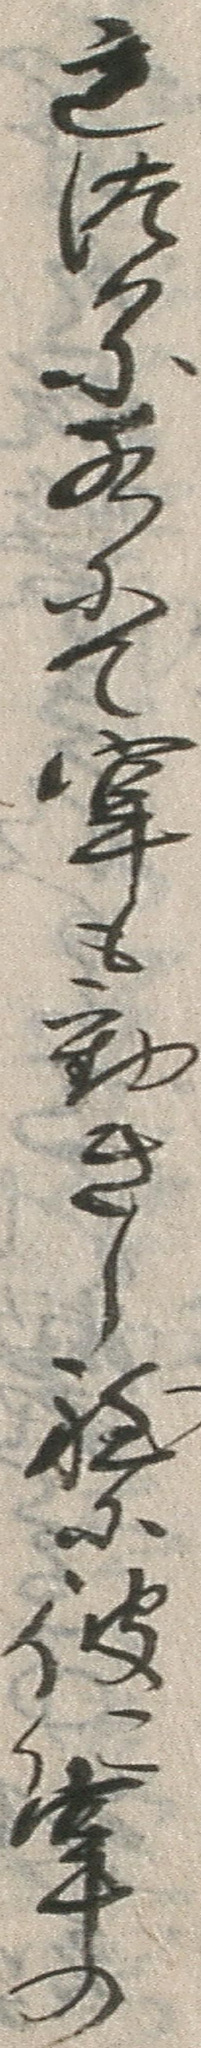れたるに水にて牢も動きし程に彼仁牢の
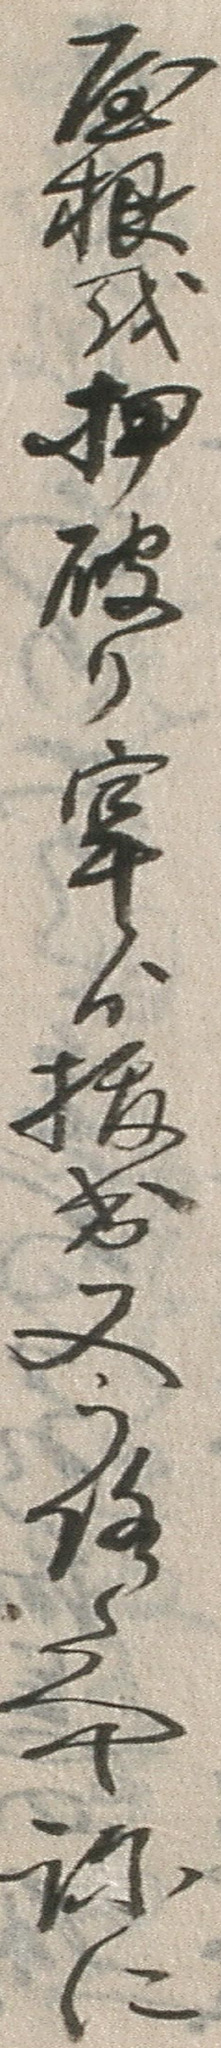屋根を押破り牢ゟ抜出又うろたへて跡に
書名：享保十三年江戸洪水記
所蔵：東京大学地震研究所図書室 Earthquake Research Institute Library, The University of Tokyo, JAPAN
